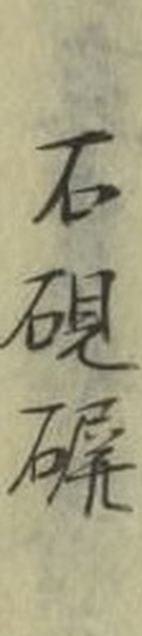石硯一
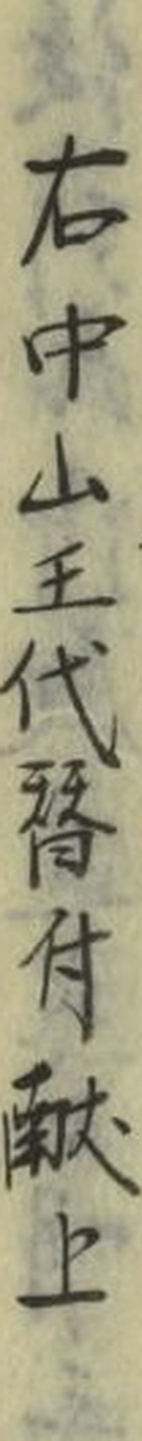右中山王代替付献上
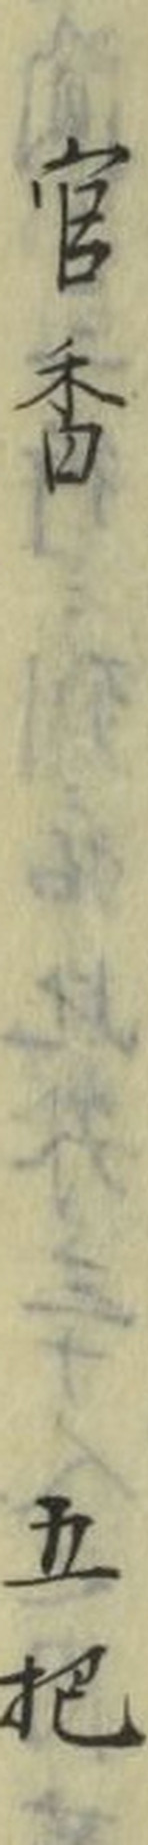官香五把
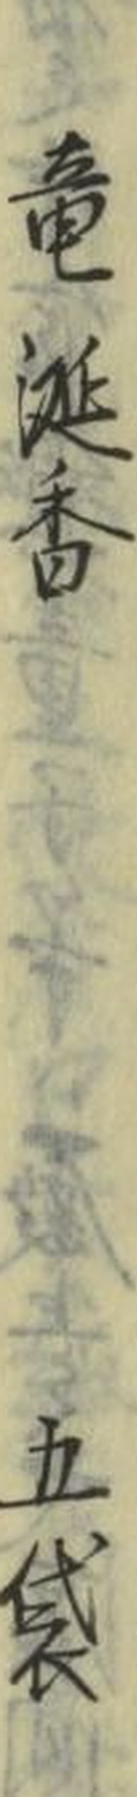竜涎香五袋
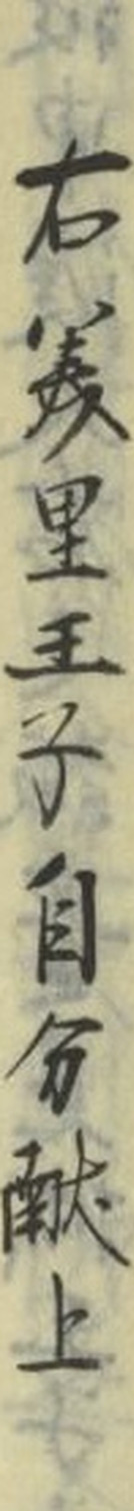右美里王子自分献上
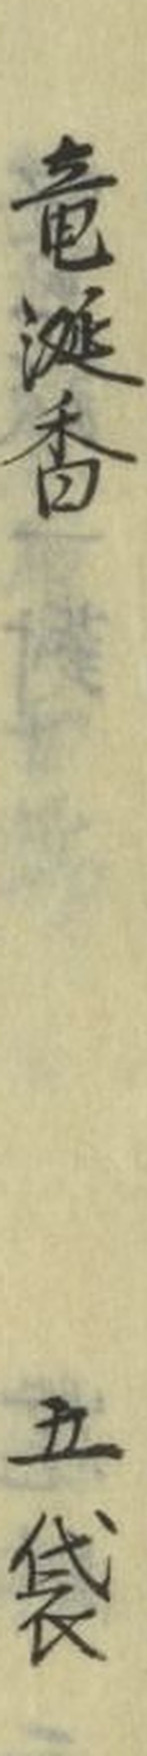竜涎香五袋
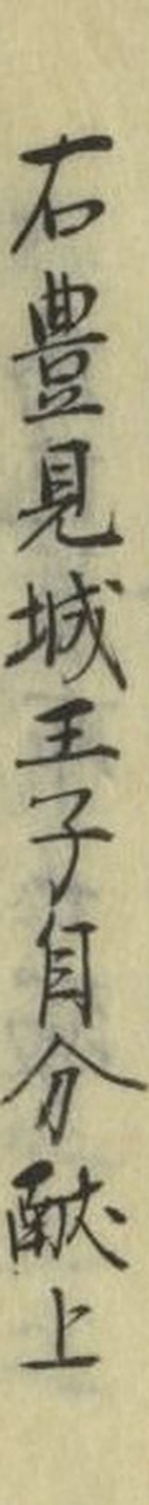右豊見城王子自分献上
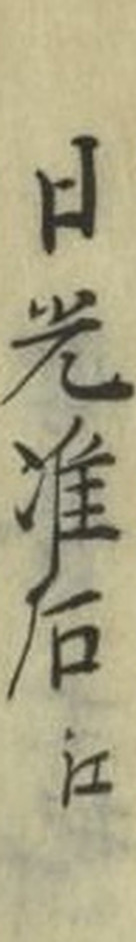日光准后え
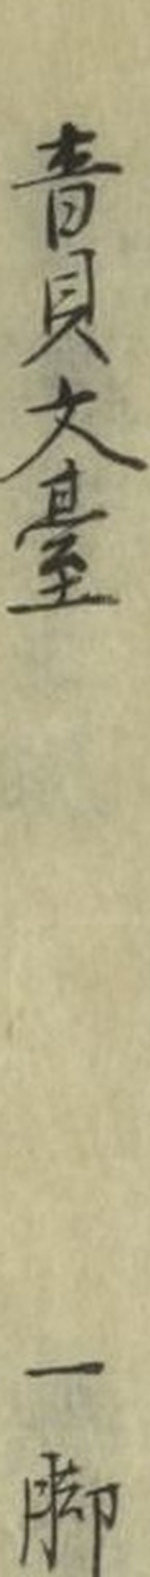青貝文台一脚
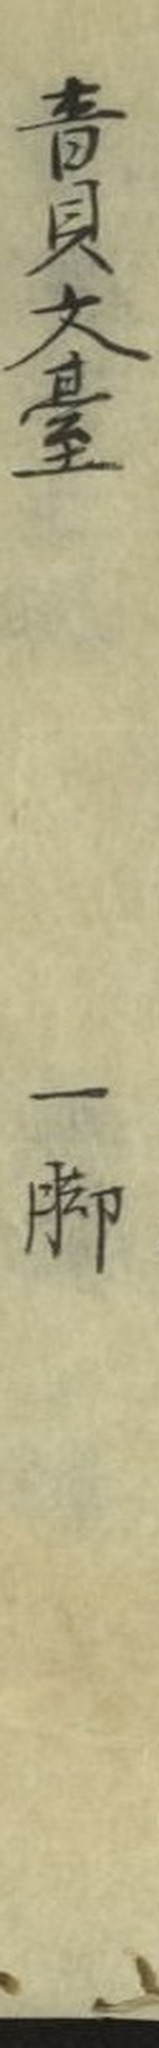青貝文台一脚
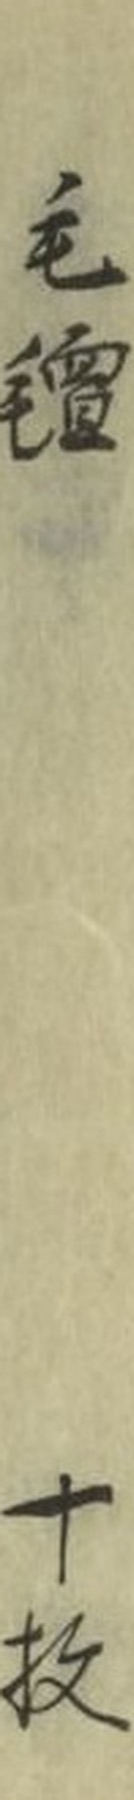毛氈十枚
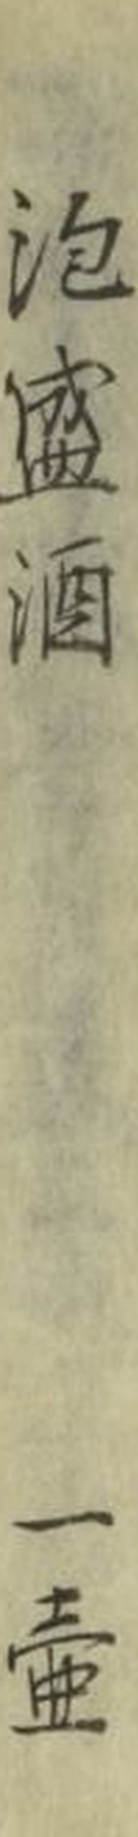泡盛酒一壷
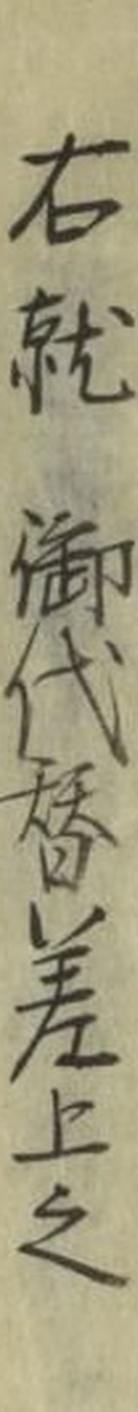右就御代替差上之
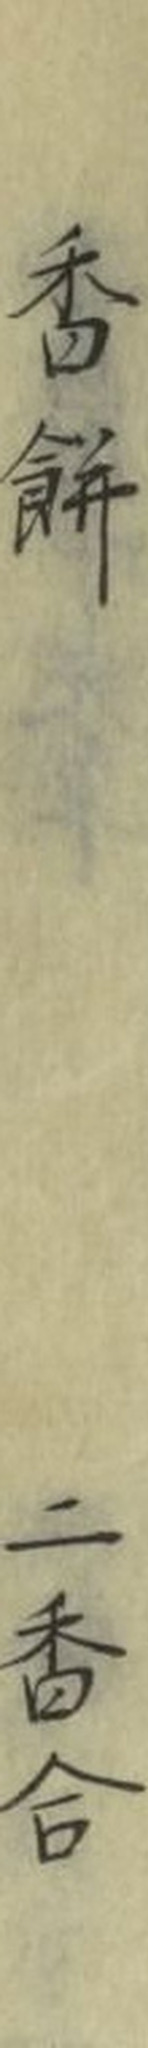香餅二香合

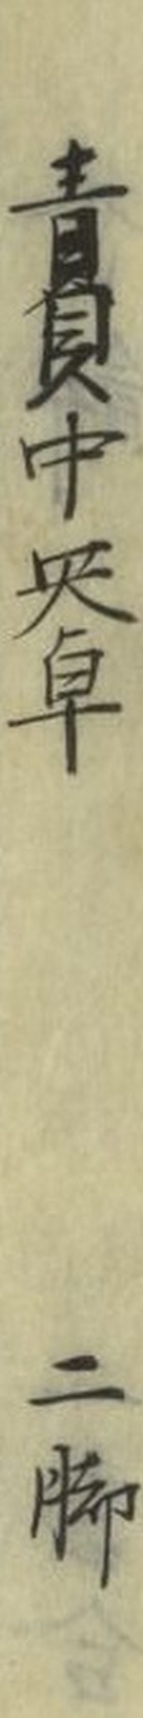青貝中央卓二脚
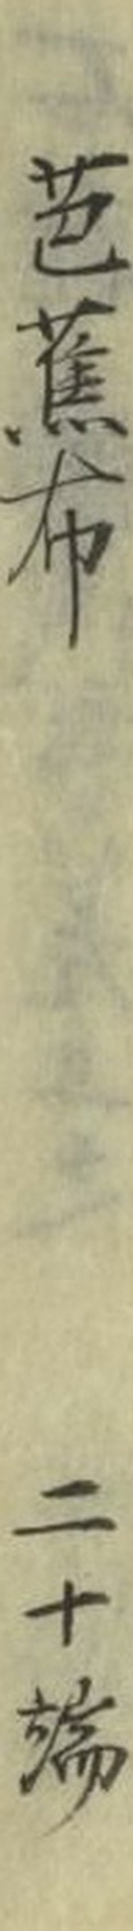芭蕉布二十端
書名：宝永七庚寅年琉球国来聘使日記
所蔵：University of the Ryukyus Library
